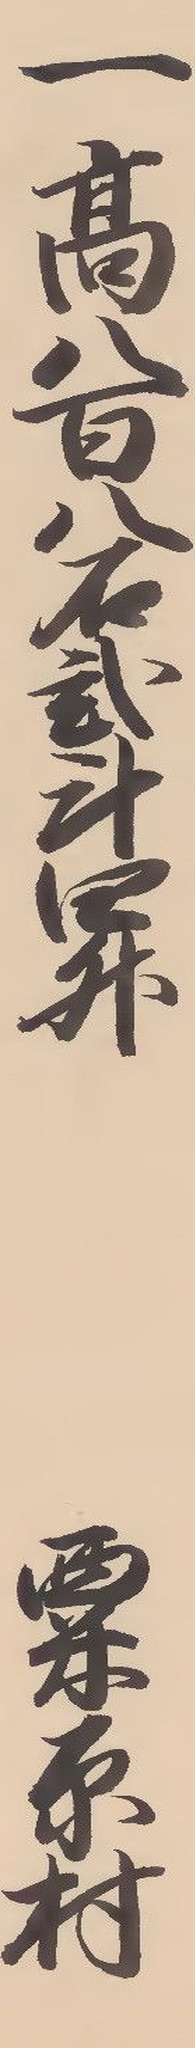一高八百八石弐斗四升粟原村
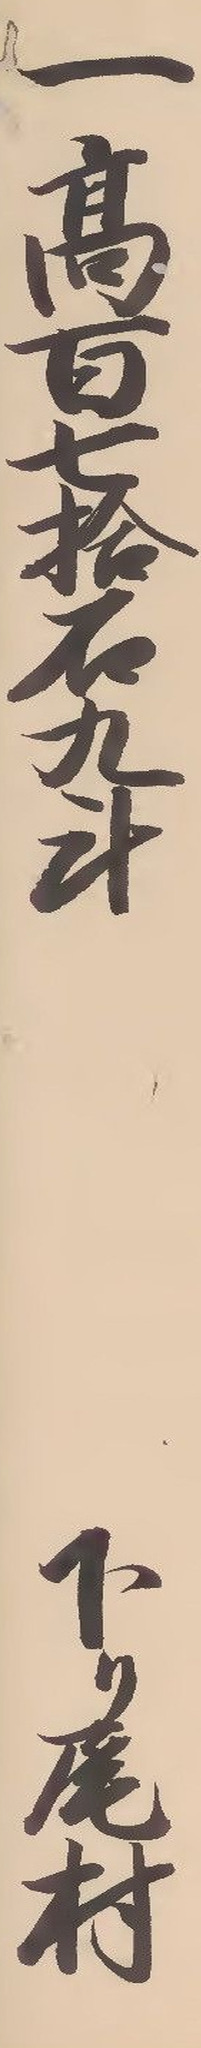一高百七拾石九斗下り尾村
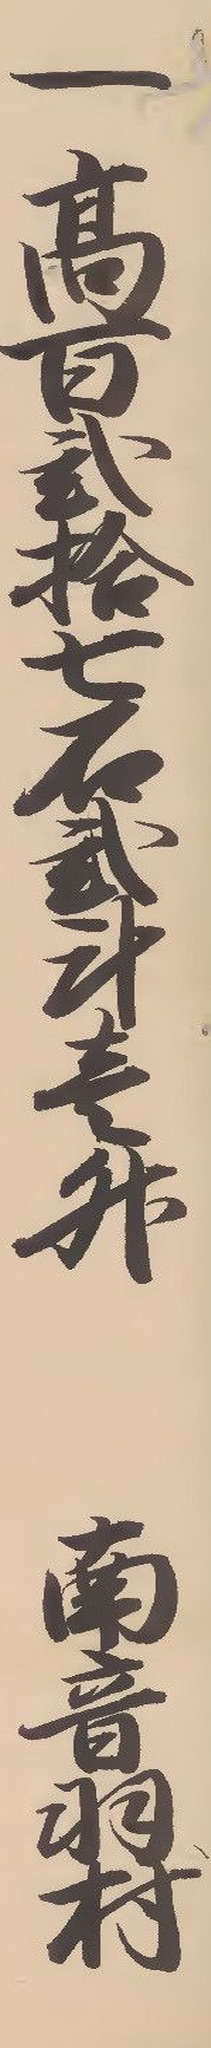一高百弐拾七石弐斗壱升南音羽村
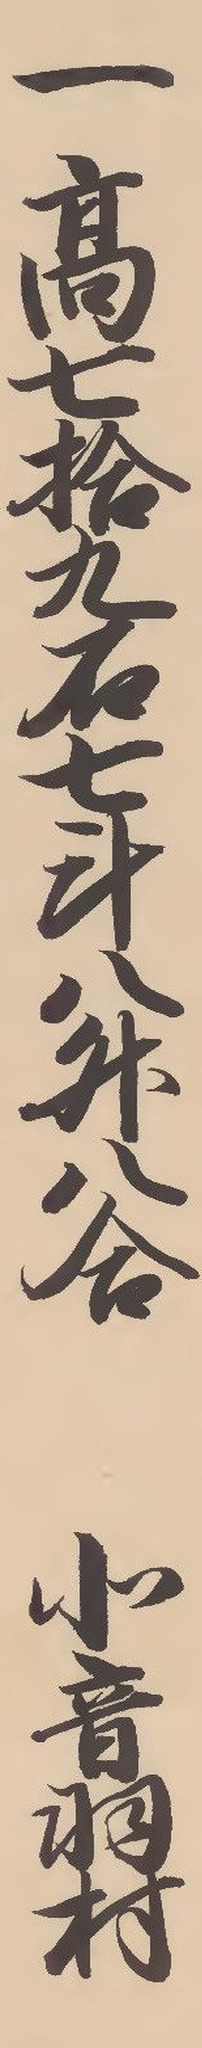一高七拾九石七斗八升八合北音羽村
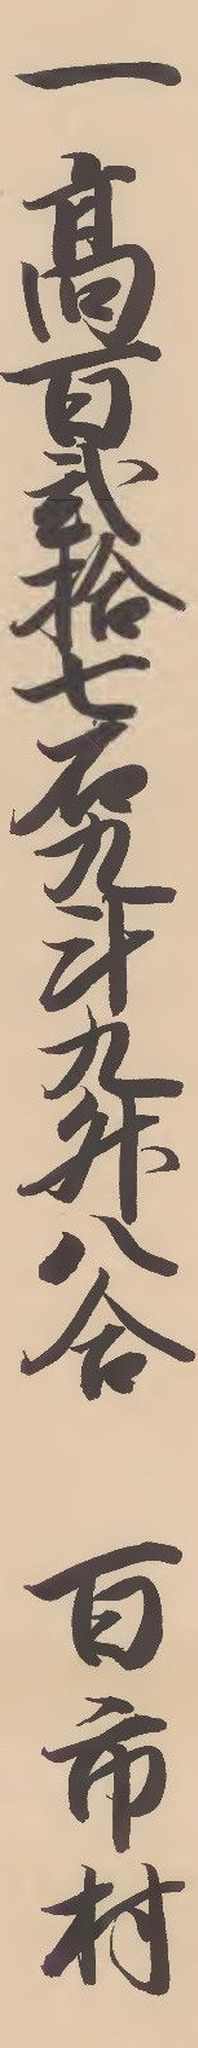一高百弐拾七石九斗九升八合百市村

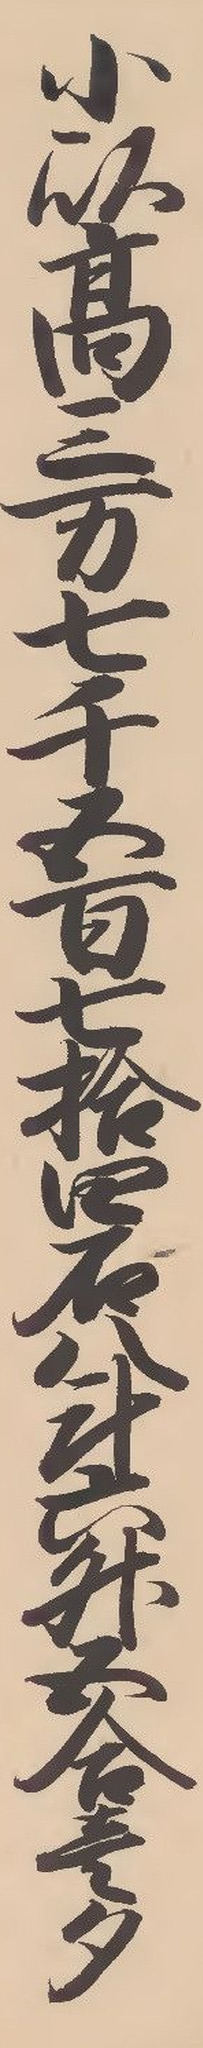小以高三万七千五百七拾四石八斗六升五合壱勺
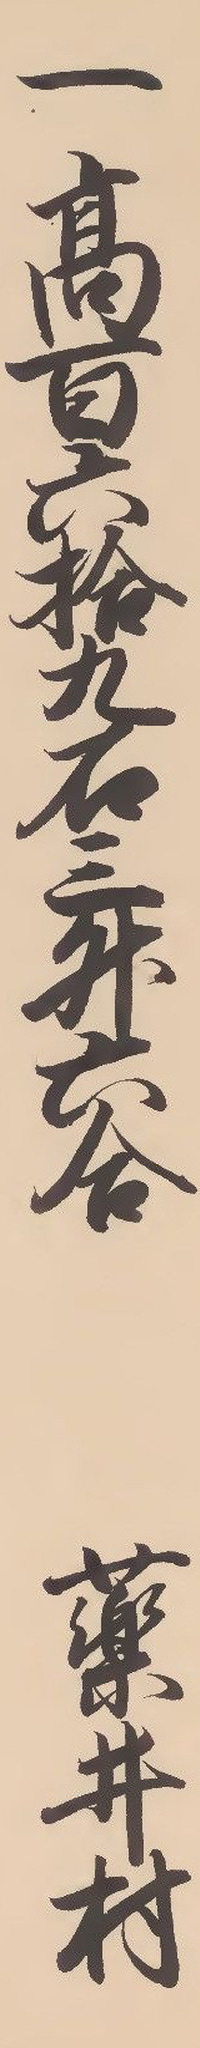一高百六拾九石三升六合薬井村
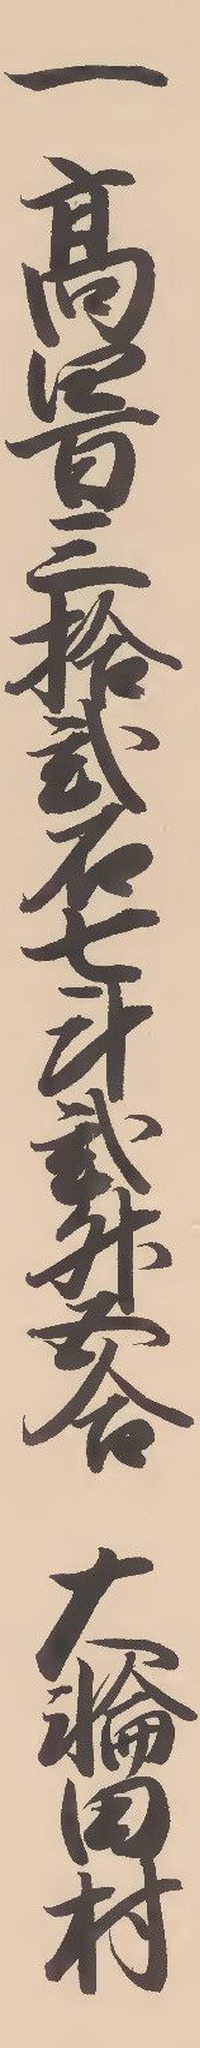一高四百三拾弐石七斗弐升五合大輪田村
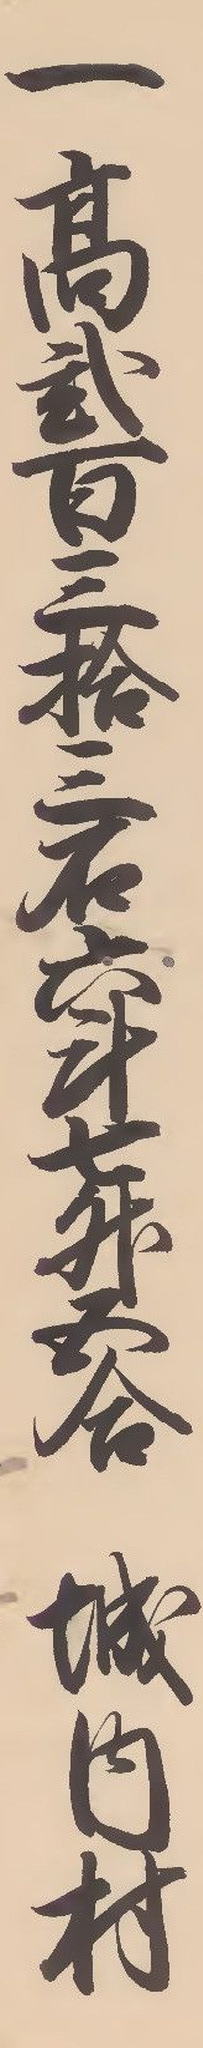一高弐百三拾三石六斗七升五合城内村

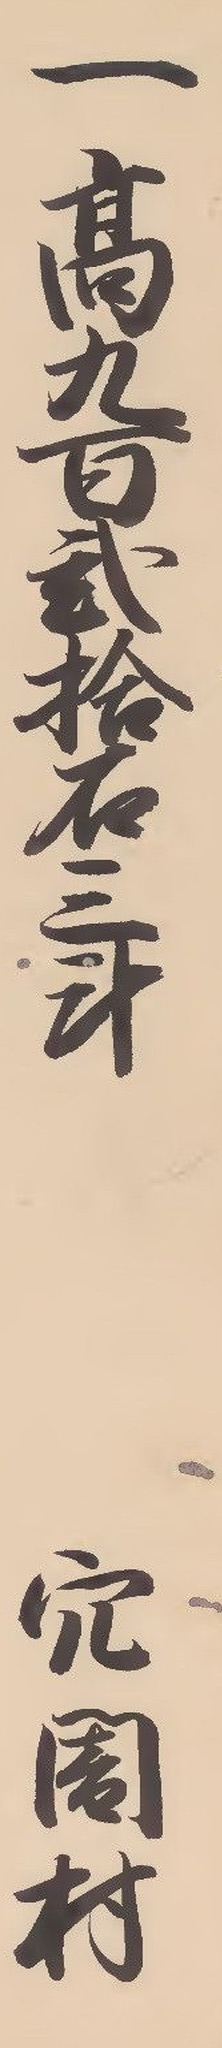一高九百弐拾石三斗穴闇村
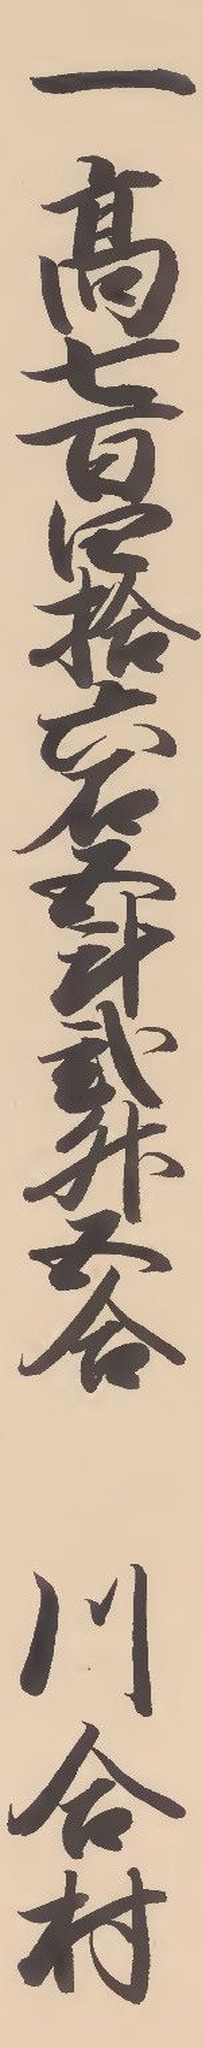一高七百四拾六石五斗弐升五合川合村
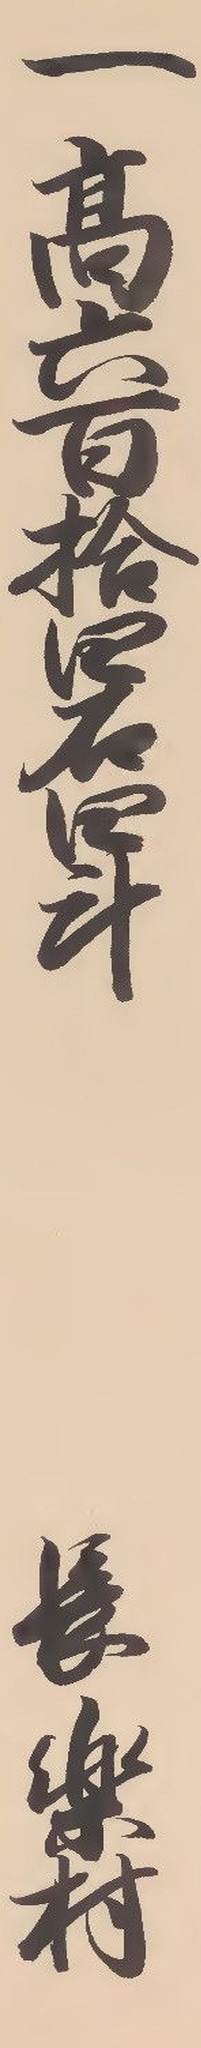一高六百拾四石四斗長楽村
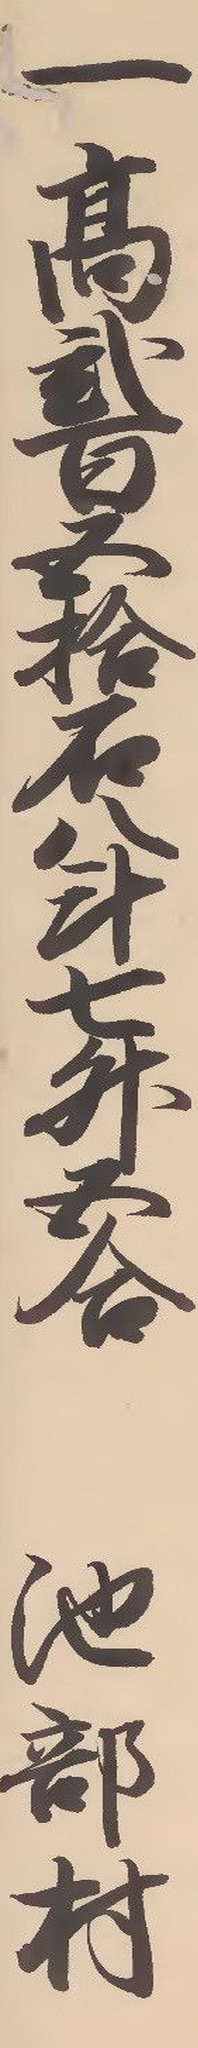一高弐百五拾石八斗七升五合池部村
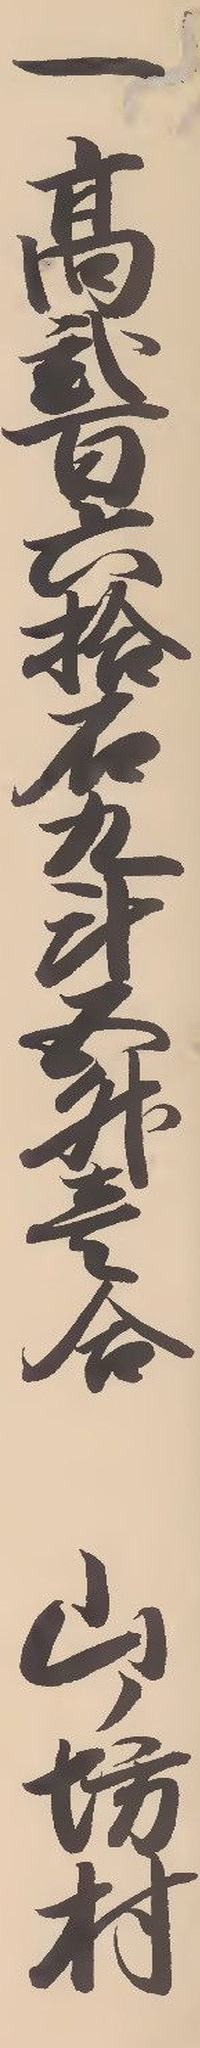一高弐百六拾石九斗五升壱合山ノ坊村
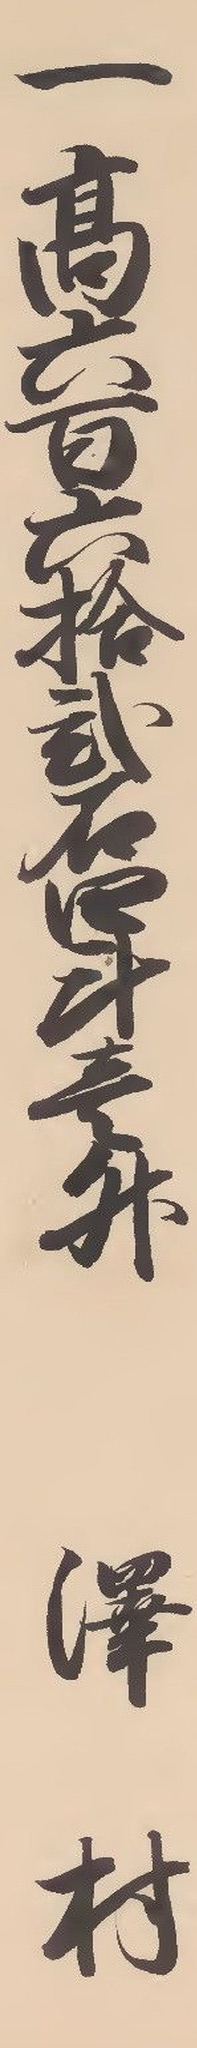一高六百六拾弐石四斗壱升沢村
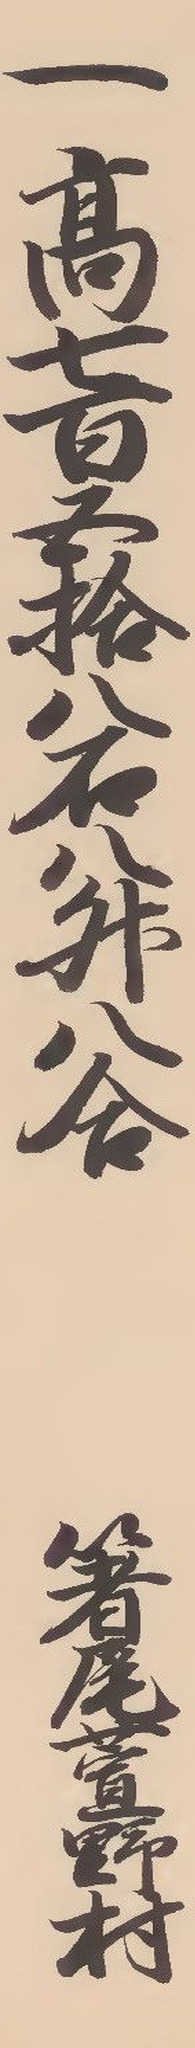一高七百五拾八石八升八合箸尾萱野村
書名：大和国郷帳
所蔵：国立公文書館 National Archives of Japan
